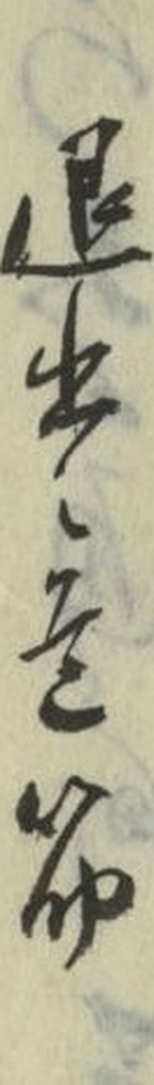退出之道筋
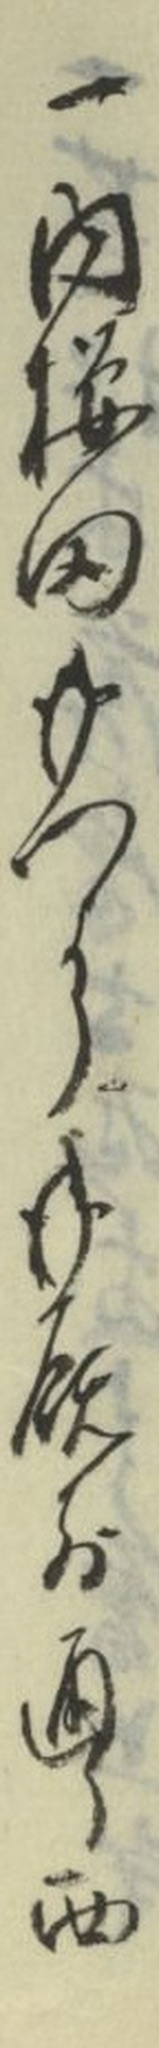一内桜田御門より御厩前通り西
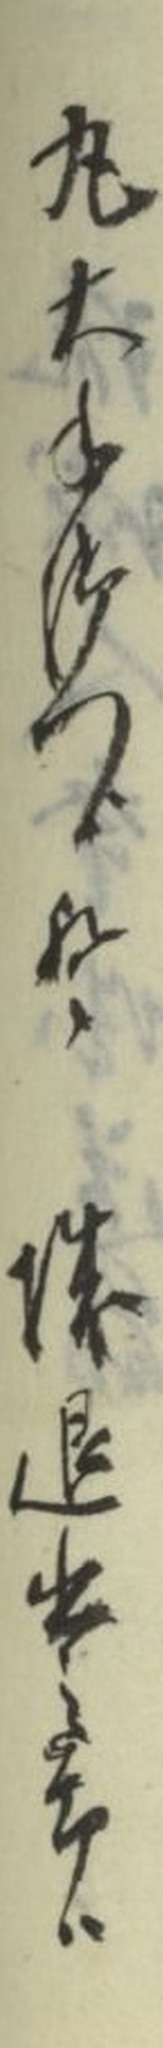丸大手門ゟ登城退出之節は
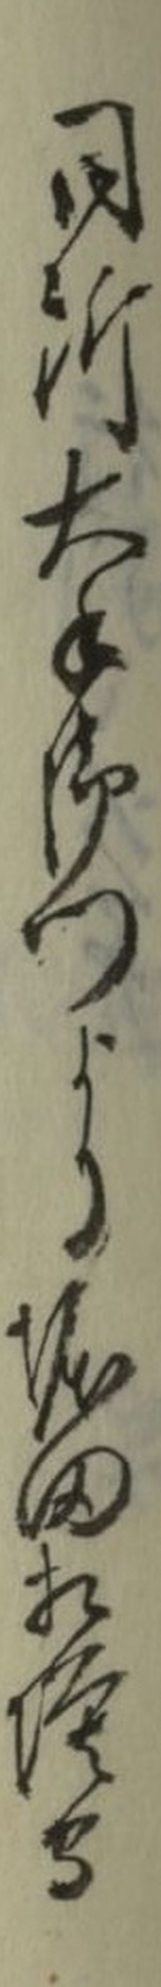同所大手御門より堀田相模守
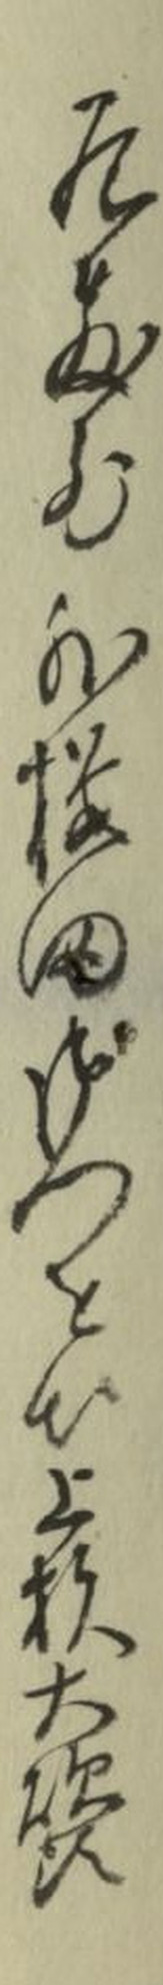屋敷前外桜田御門を出上杉大炊頭
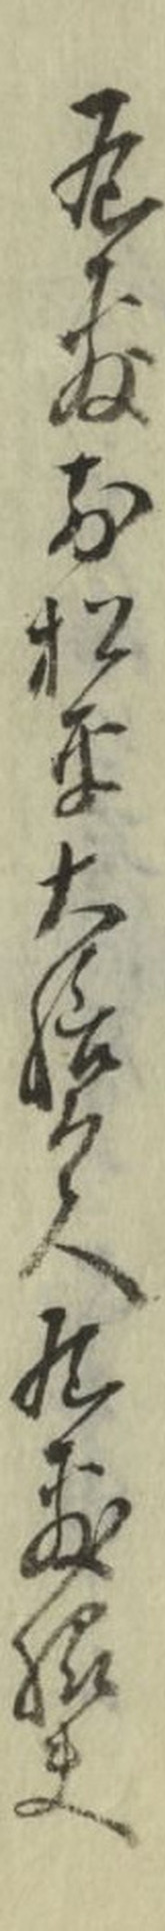屋敷前松平大膳大夫屋敷脇夫
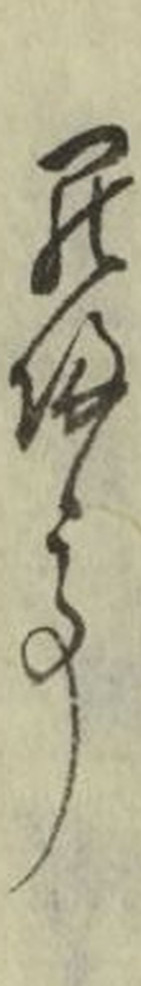罷帰候事

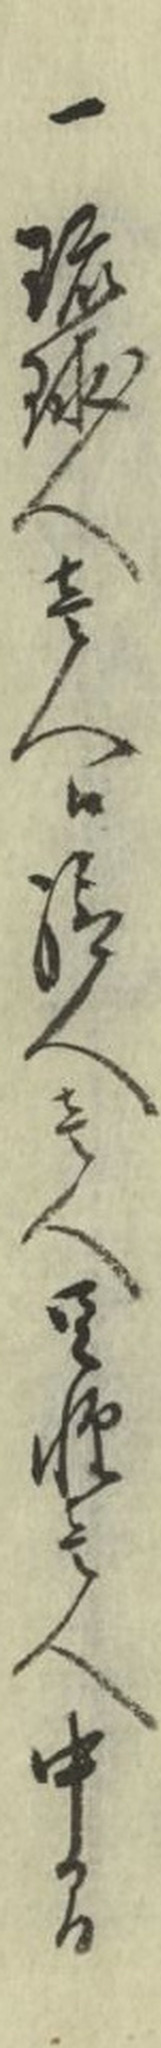一琉球人壱人え給人壱人足軽壱人中間
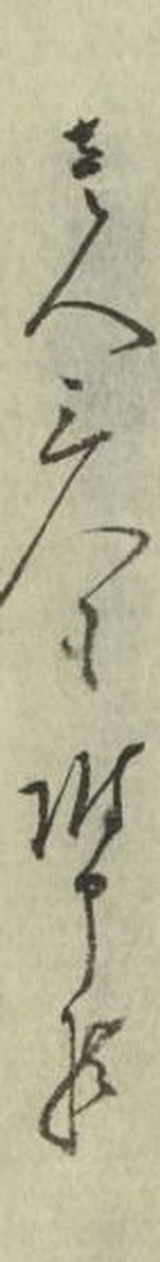壱人三人ツヽ附申候
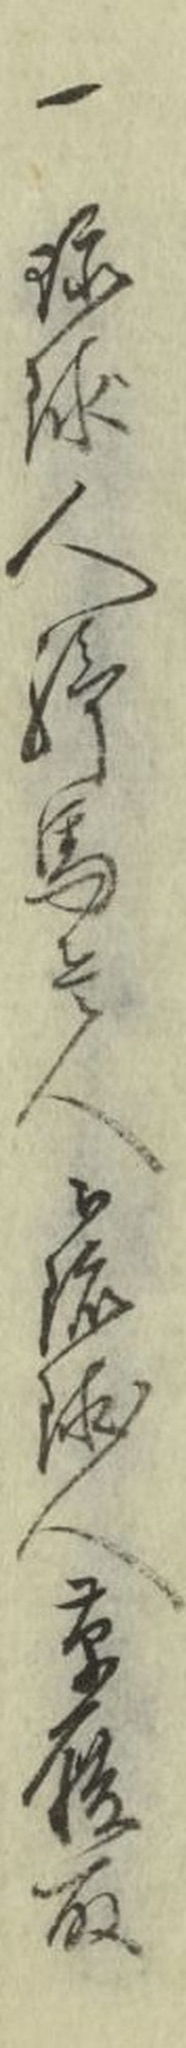一琉球人騎馬壱人え琉球人草履取
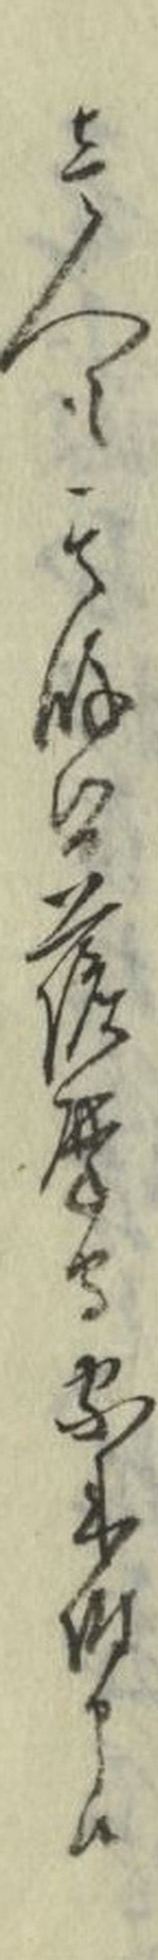壱人ツヽ其余は薩摩守家来附申候
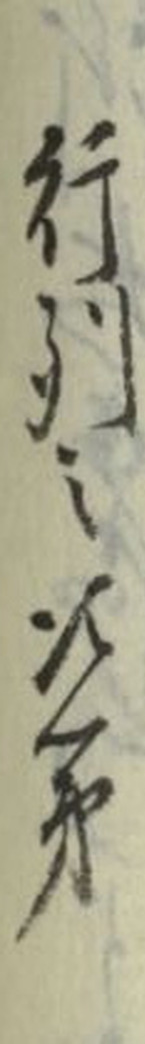行列之次第

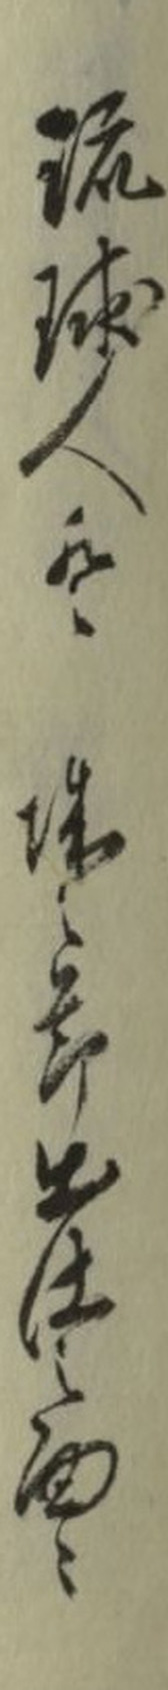琉球人登城之節出仕之面々
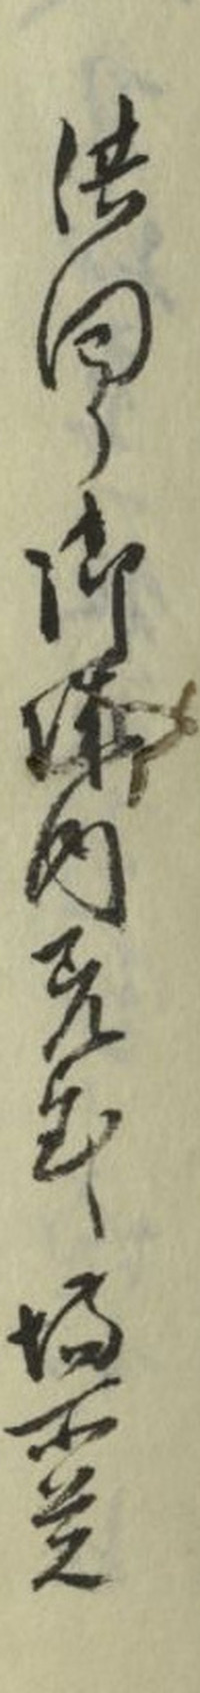供回り御城内差置之場所覚
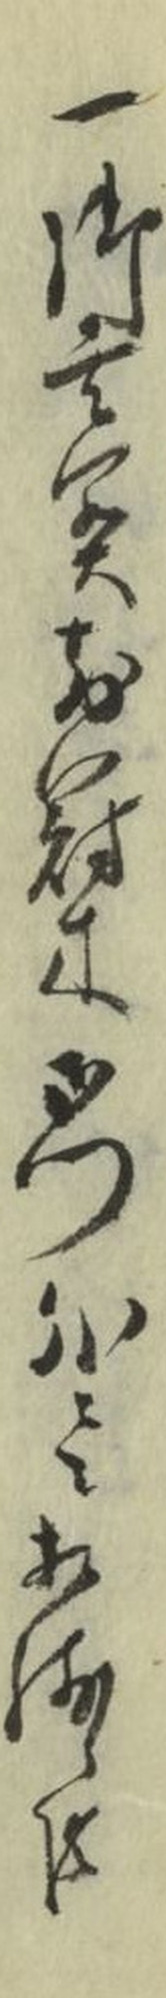一御玄関前冠木御門外に而相残り候
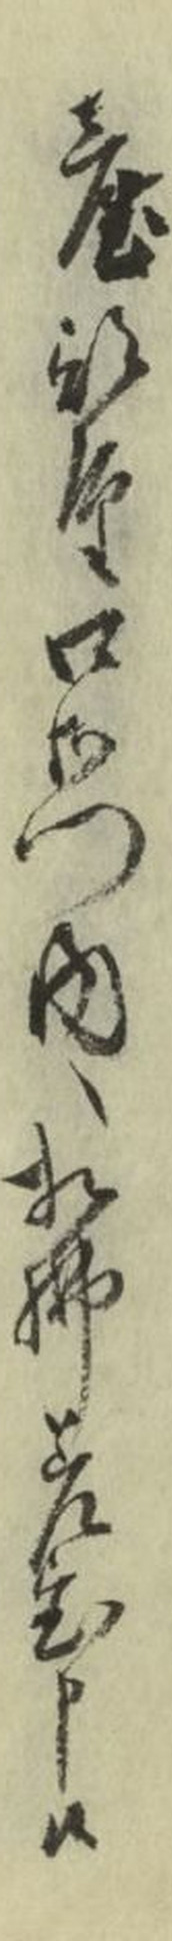台部屋口御門内へ相払差置申候
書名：琉球人来朝記 四之五
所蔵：University of the Ryukyus Library
